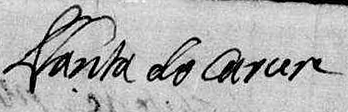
Planta do carcere
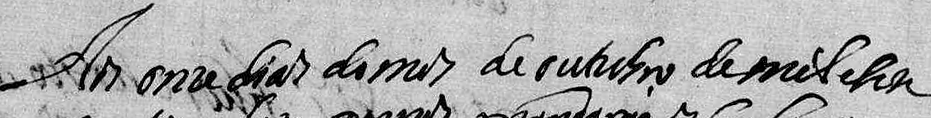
Aos onze dias do mes de outubro de mil e sete
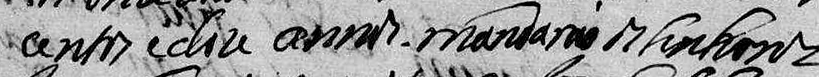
centos, e doze annos. mandaraõ os Senhorez
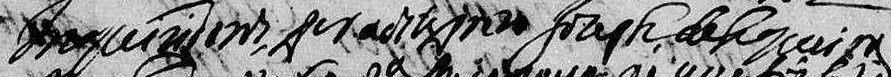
Inquizidores, pera este prezo Jozeph de sequeira
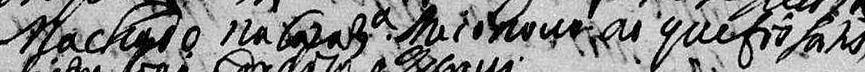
Machado na caza 3a. Meio noua ao que foi satis
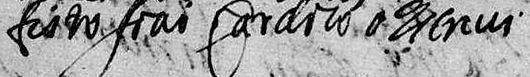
feito Joaõ Cardozo o Escreui
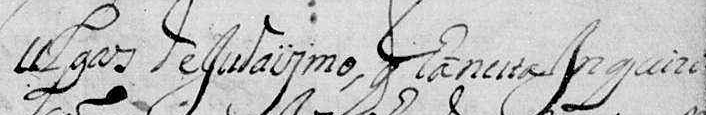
Culpas de Judaismo, q̄ há nesta Jnquizi
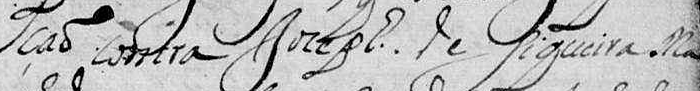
çaõ contra Jozeph. de siqueira Ma
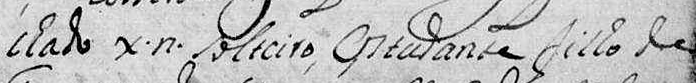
chado x. n. solteiro, estudante filho de
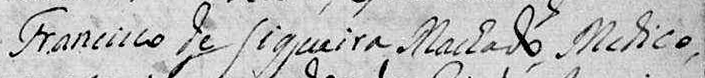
Francisco de siqueira Machado, Medico,
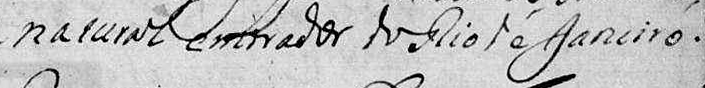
natural e morador do Rio de Janeiro.
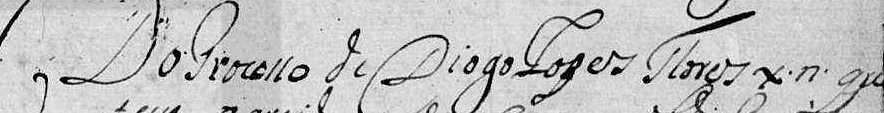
Do Processo de Diogo Lopes Flores x. n. qu
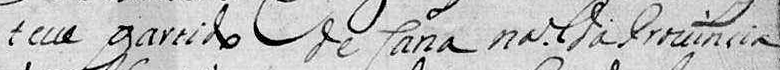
teue partido de Cana na.l da Prouincia
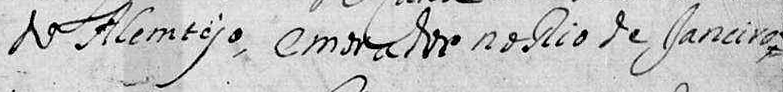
do Alemtejo, e morador no Rio de Janeiro,
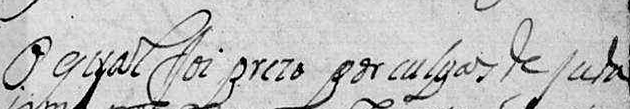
O qual foi prezo por culpas de juda
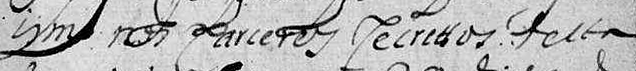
ismo nos Carceres Cecrettos desta
